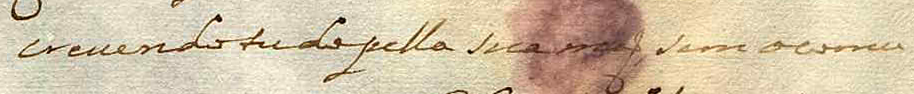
creuendo tudo pella sua maõ, sem o comu
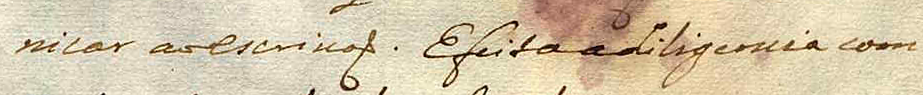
nicar ao escriuaõ. E feita a diligencia com
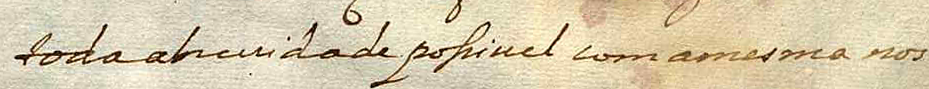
toda a breuidade possiuel com a mesma nos
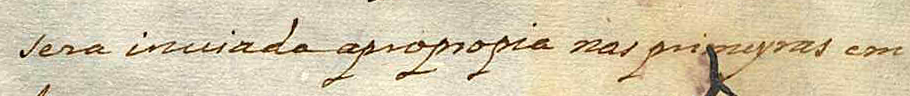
sera inuiada a propropia nas primeyras em
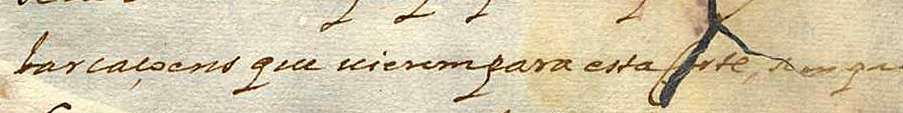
barcaçoens que uierem para esta C rte, sem que
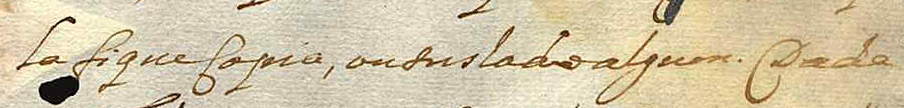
la fique Copia, ou treslado algum. Dada
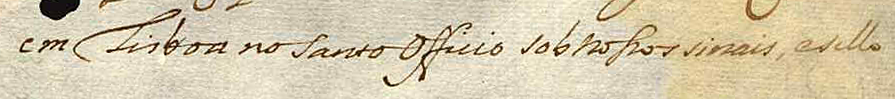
em Lisboa no santo Officio sob nossos sinais, e sello
